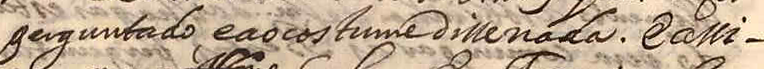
perguntado, e ao costume disse nada. E assi
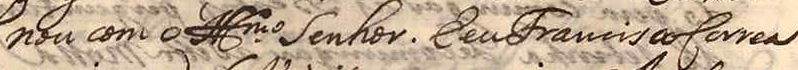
nou com o Ill.mo Senhor. E eu Francisco Correa
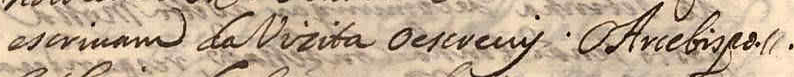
escriuam da Vizita o escreuy. O Arcebispo.//.
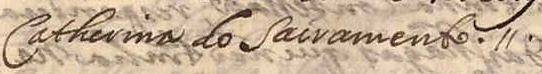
Catherina do Sacramento.//.
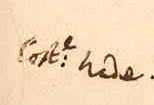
Cost.e nada.
